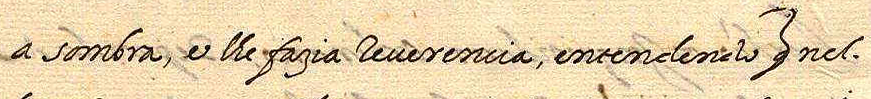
a sombra, e lhe fazia Reuerencia, entendendo q̄ nel
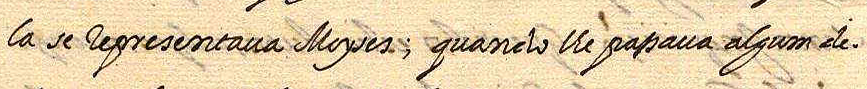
la se representaua Moyses; quando lhe passaua algum de
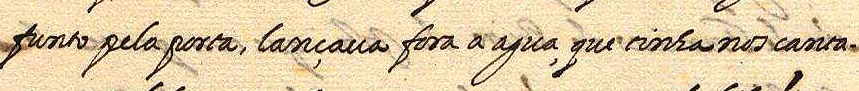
funto pela porta, lançaua fora a agua, que tinha nos canta
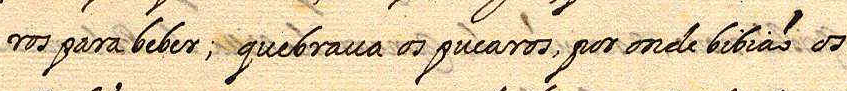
ros para beber; quebraua os pucaros, por onde bibiaõ os
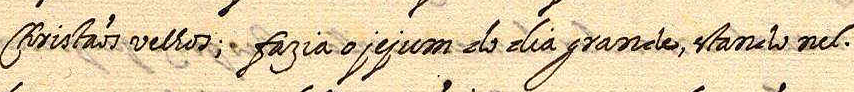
Christaõs velhos; fazia o jejum do dia grande, estando nel
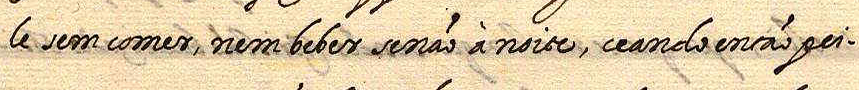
le sem comer, nem beber senaõ à noite, ceando entaõ pei
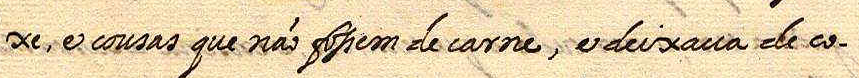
xe, e cousas que naõ fossem de carne, e deixaua de co
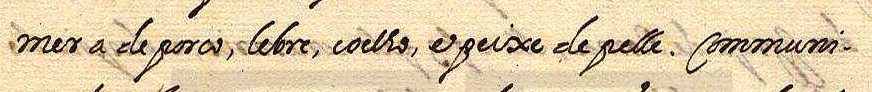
mer a de porco, lebre, coelho, e peixe de pelle. Communi
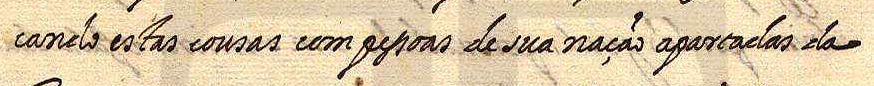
cando estas cousas com pessoas de sua naçaõ apartadas da
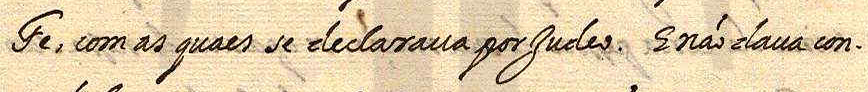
Fe, com as quaes se declaraua por Judeo. E naõ daua con
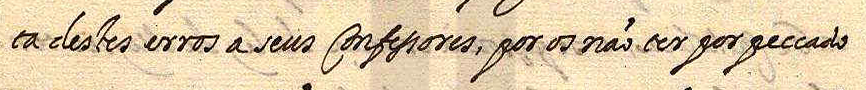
ta destes erros a seus Confessores, por os naõ ter por peccado
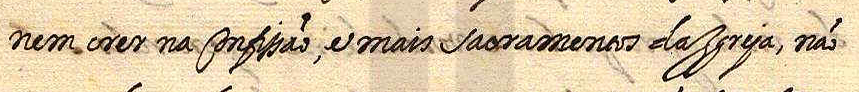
nem crer na Confissaõ, e mais sacramentos da Jgreja, naõ
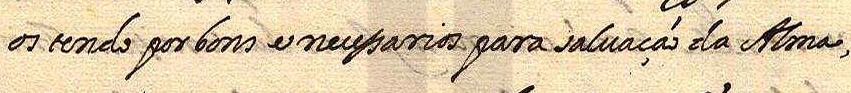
os tendo por bons e necessarios para saluaçaõ da Alma,
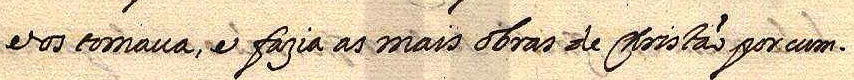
e os tomaua, e fazia as mais obras de Christaõ por cum
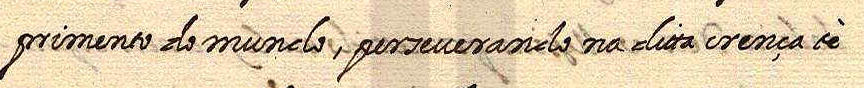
primento do mundo, perseuerando na ditta crença tè
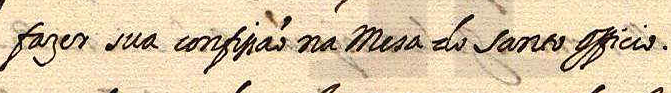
fazer sua confissaõ na mesa do Santo Officio.
